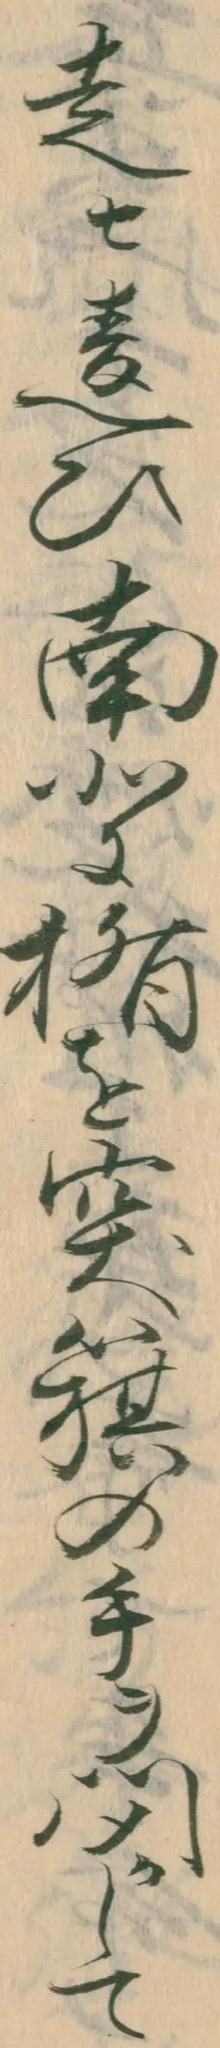走せ違ひ南北に楯を突簱の手を聞かして
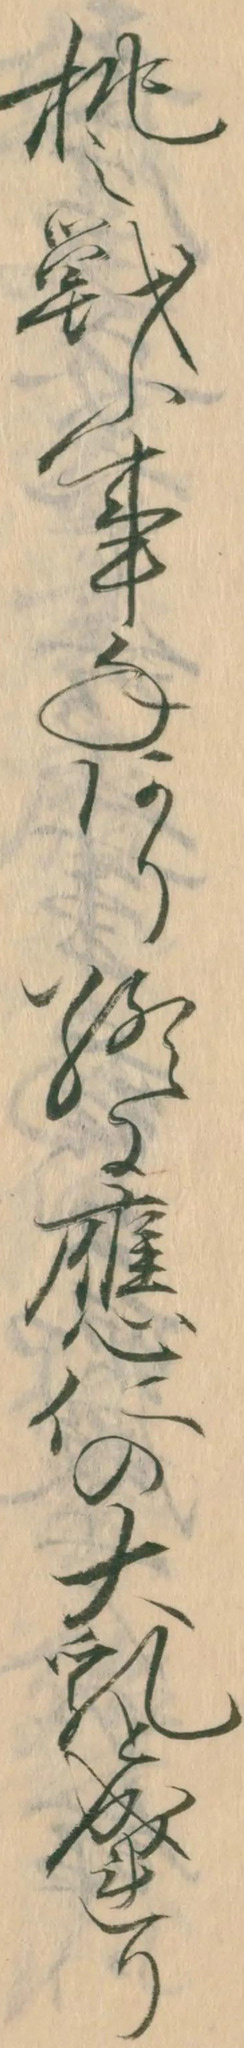挑み戦ふ事年あり終に応仁の大乱と成れり
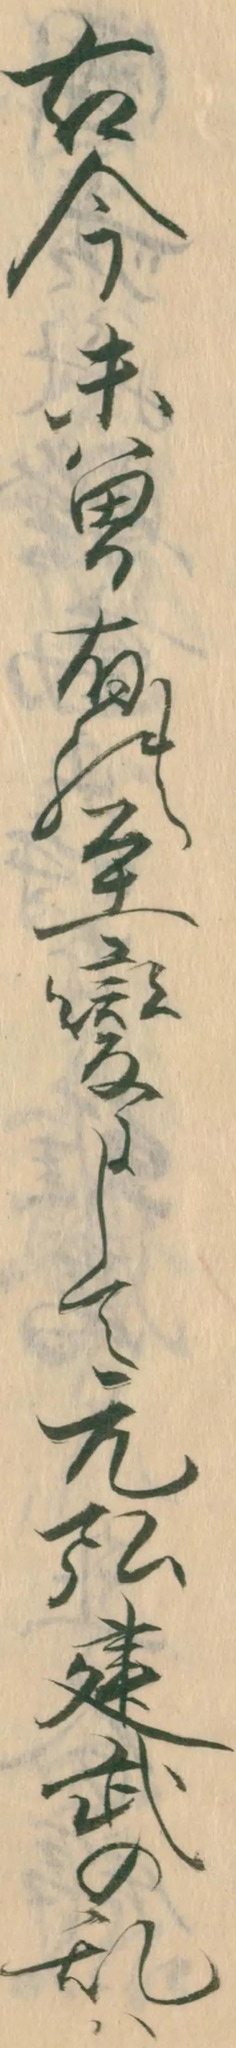古今未曾有の至変にして元弘建武の乱は
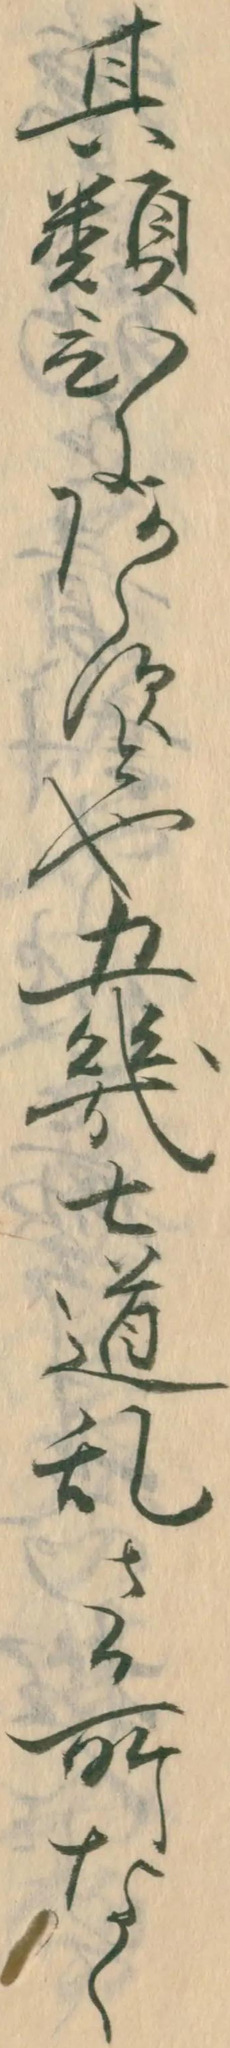其類ひにあらすとや五畿七道乱さる所なく
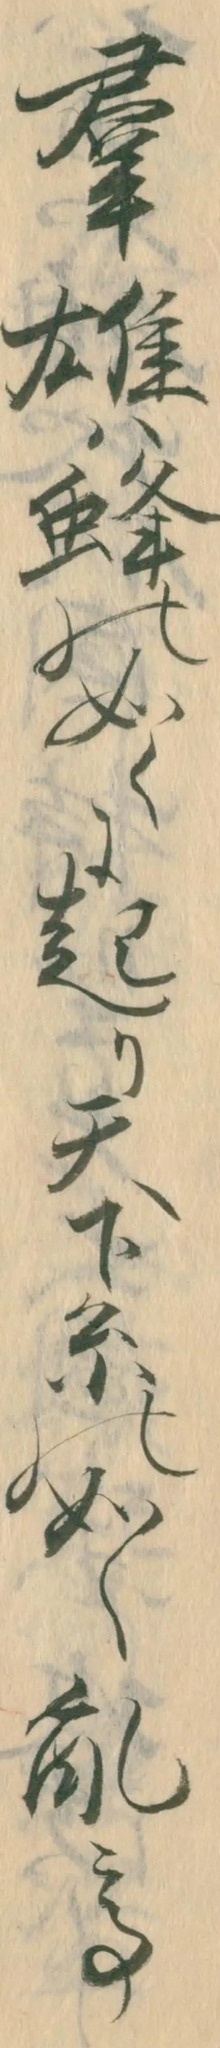群雄は蜂の如くに起り天下糸の如く乱て

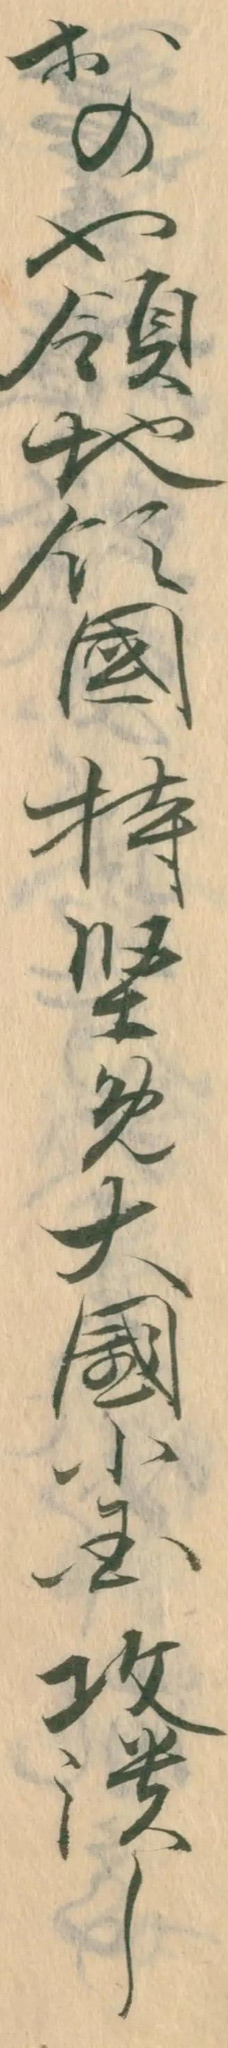おのや領地領国持堅め大国小国攻潰し
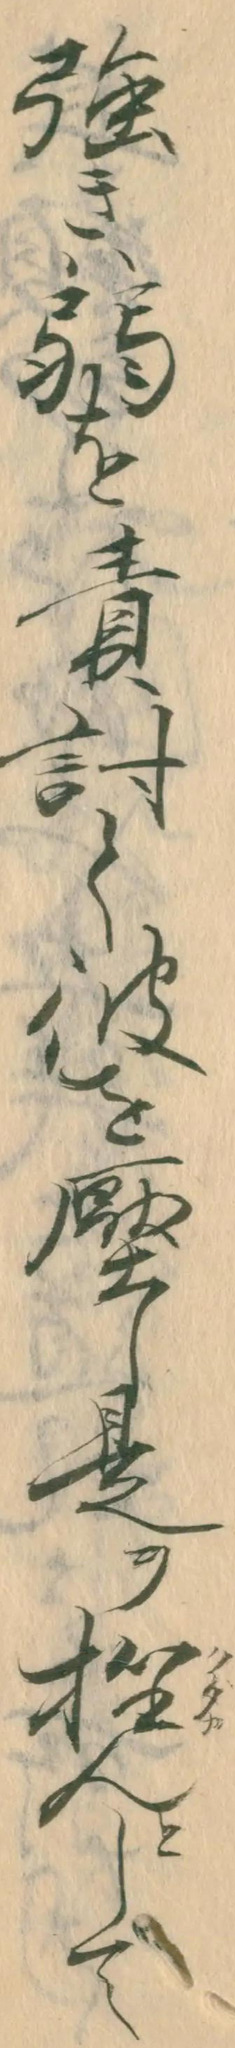強きは弱を責討て彼を圧し是を挫んとして
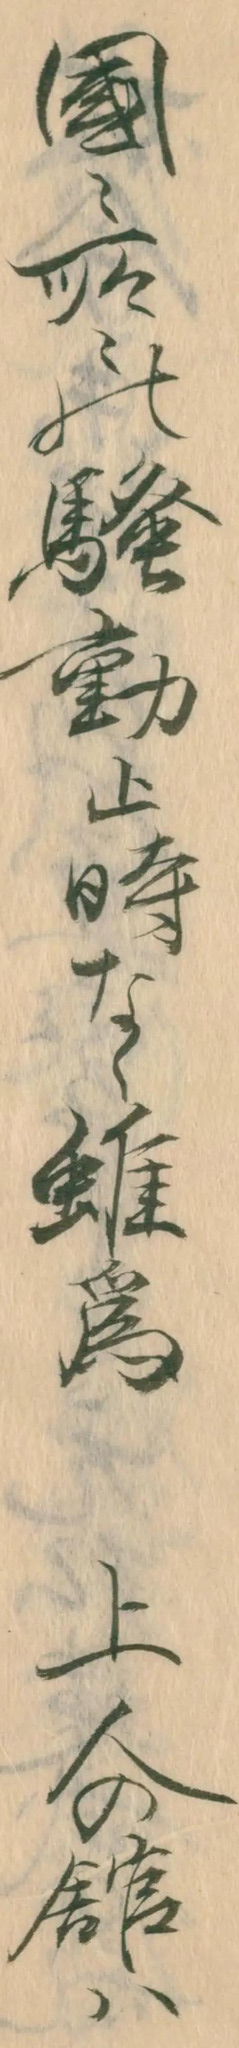国々所々の騒動止時なく雖為上人の館は
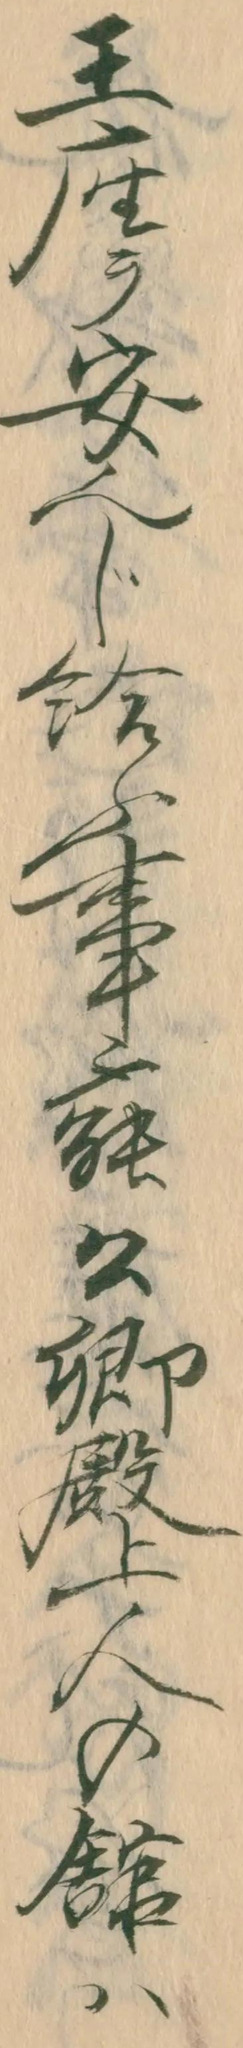王座を安んじ給ふ事不能公卿殿上人の館は
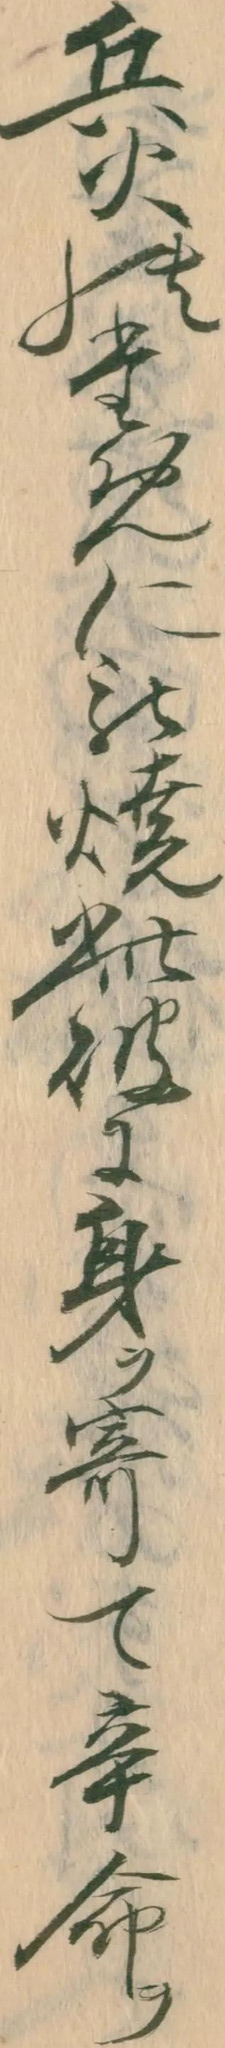兵火のために被焼此彼に身を寄て辛命を
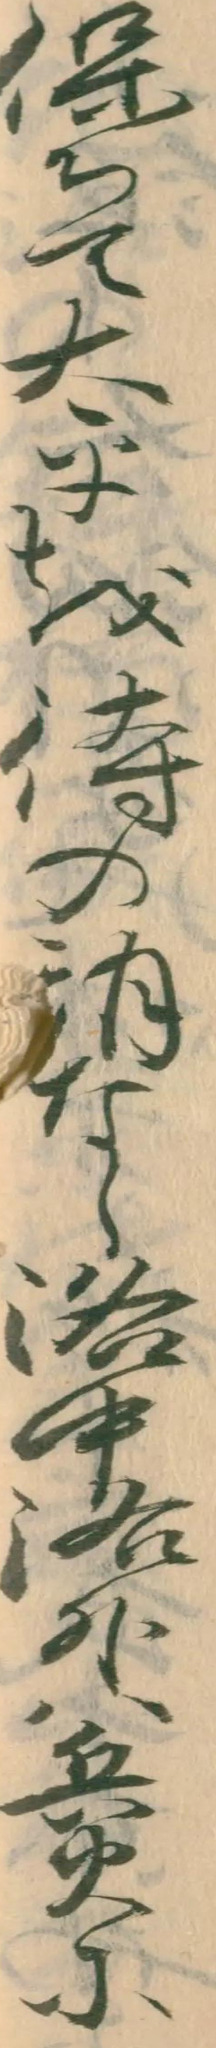保ちて大平を待の期なし洛中洛外は兵火に
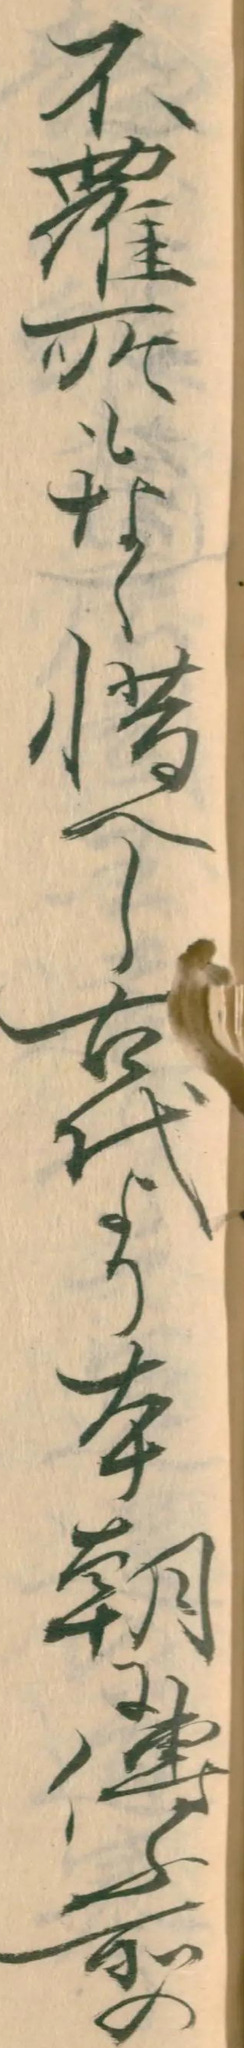不羅所もなく惜へし古代より本朝に伝ふ所の
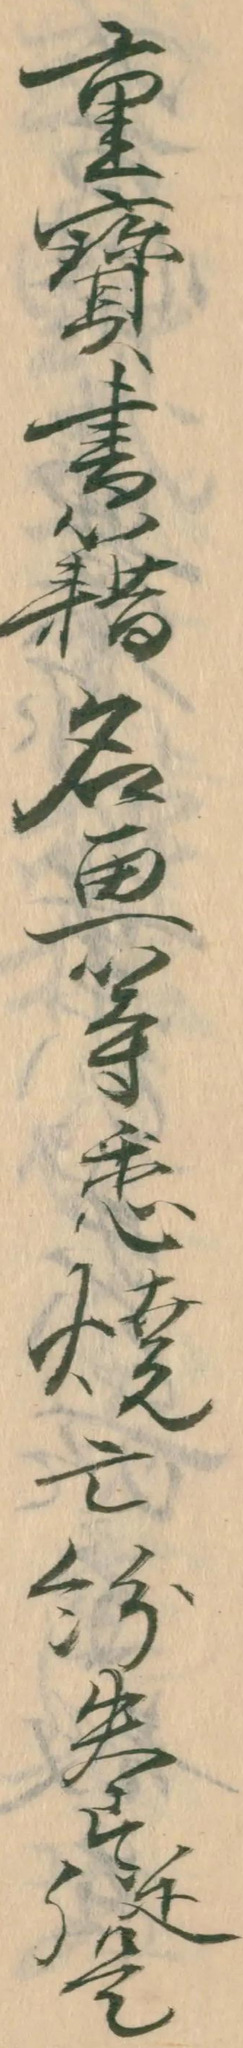重宝書籍名画等悉焼亡紛失す従是
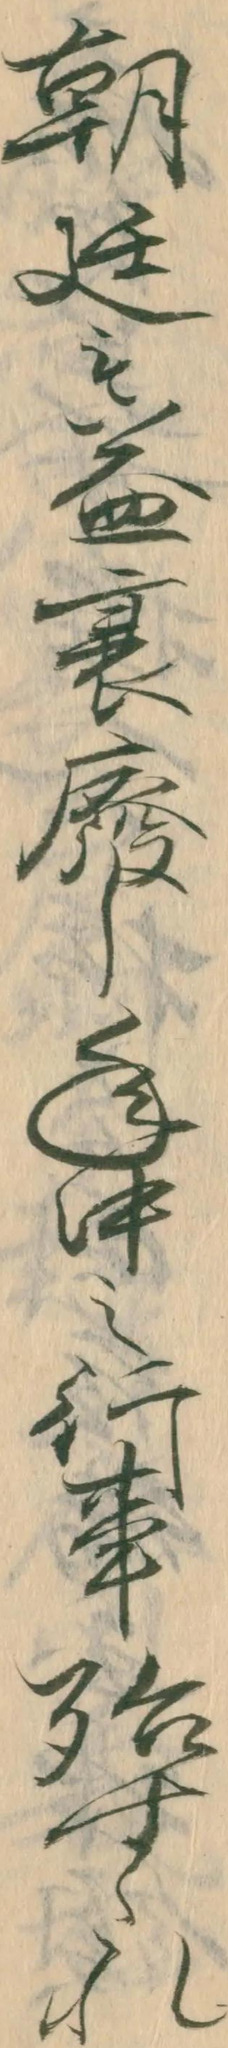朝廷も益衰廃し年中之行事殆すたれ
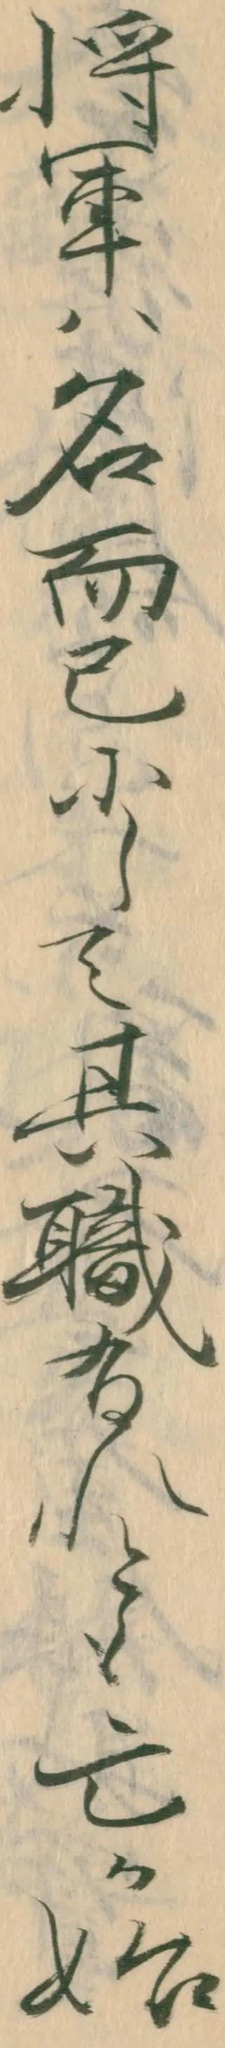将軍は名而已にして其職有れとも亡か始
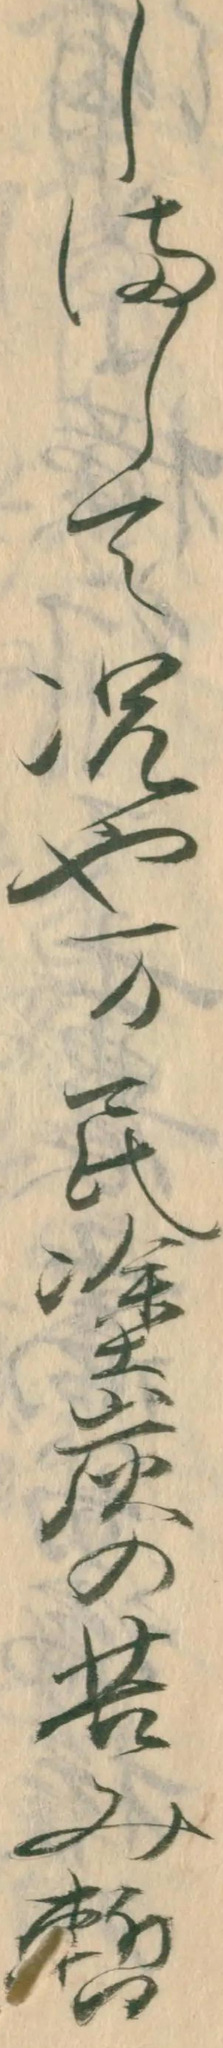しまして況や万民塗炭の苦み暫
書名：賀茂社記録. 第12冊
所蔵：国立国会図書館 National Diet Library, JAPAN
